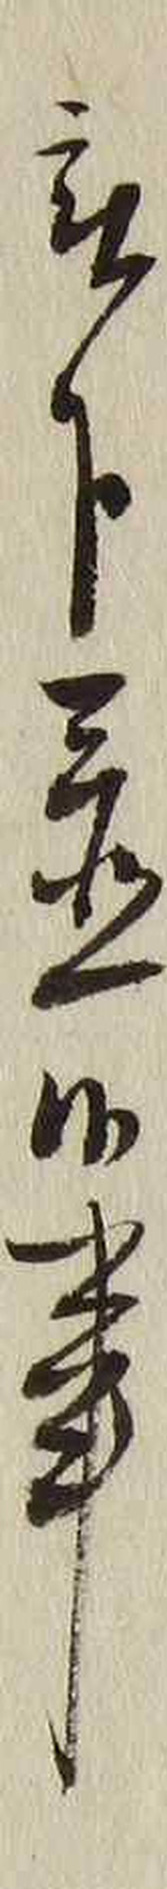被下置候事
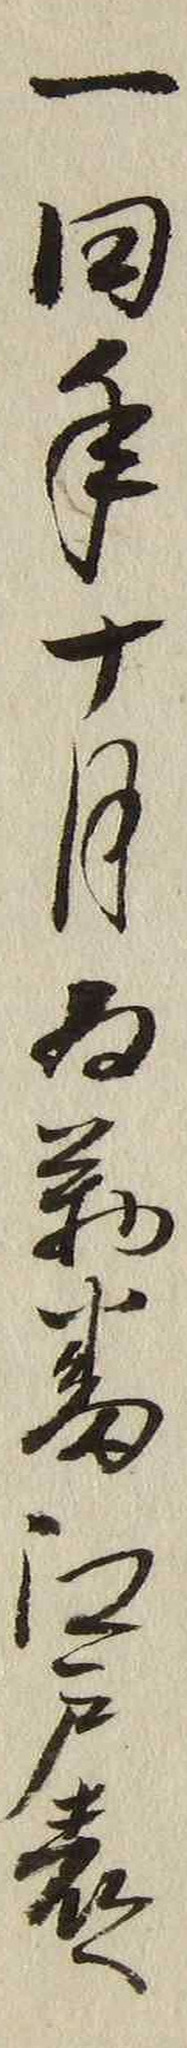一同年十月為勤番江戸表へ
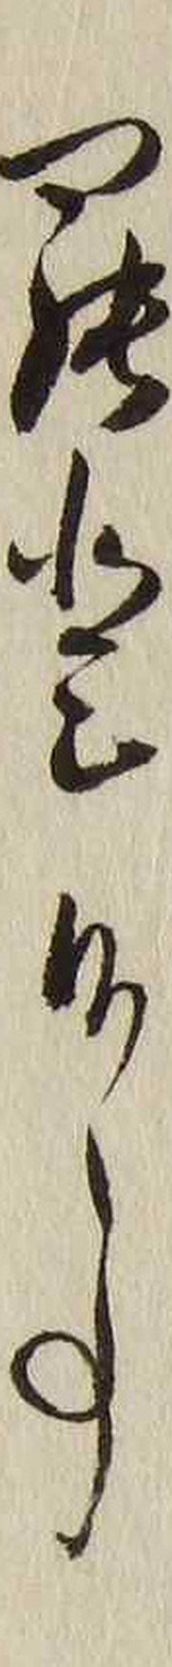罷登候事
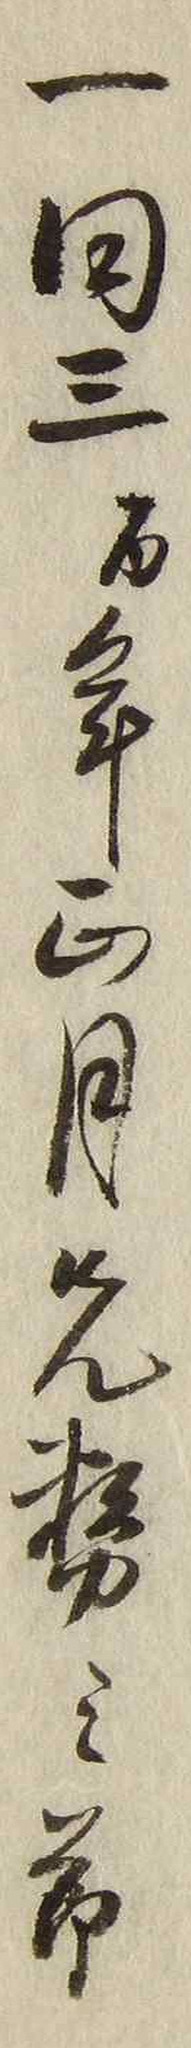一同三酉年正月先務之節

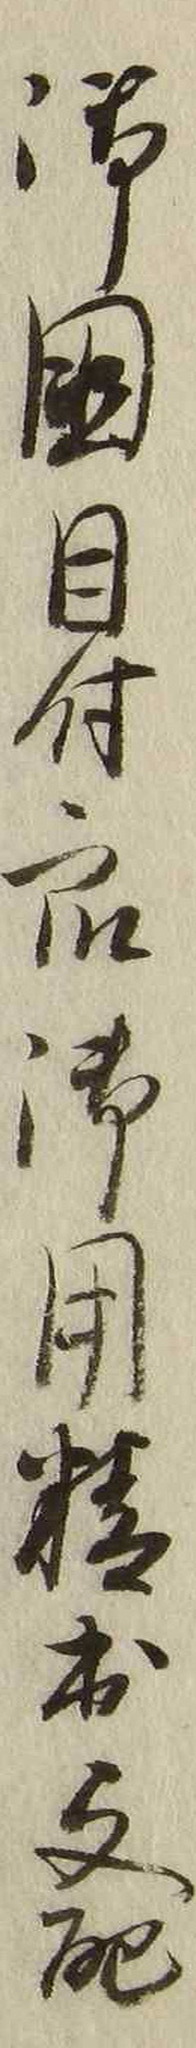御国目付衆御用精出支配
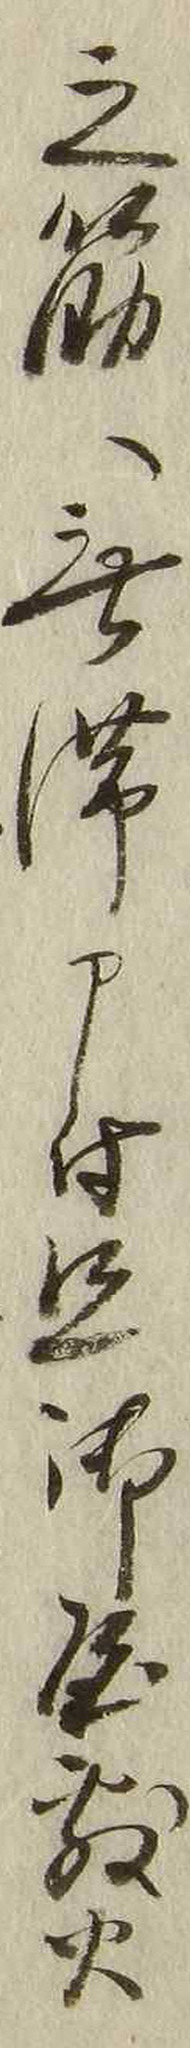之筋へ無滞申付且御屋敷火
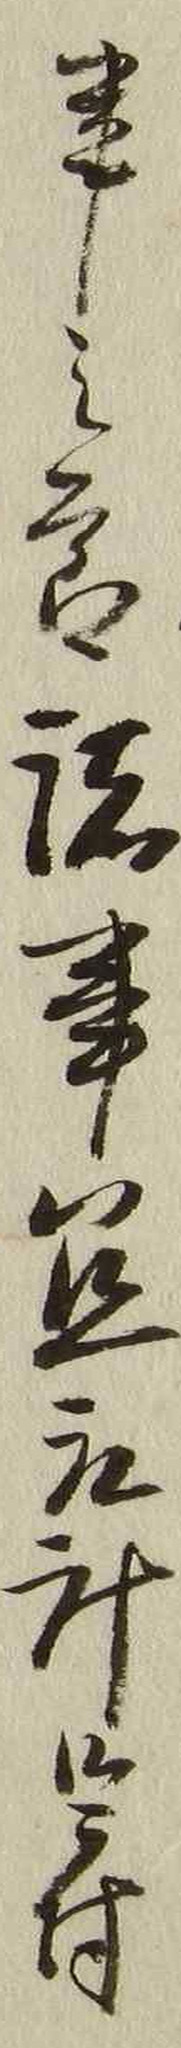事之節諸事宜取計候ニ付
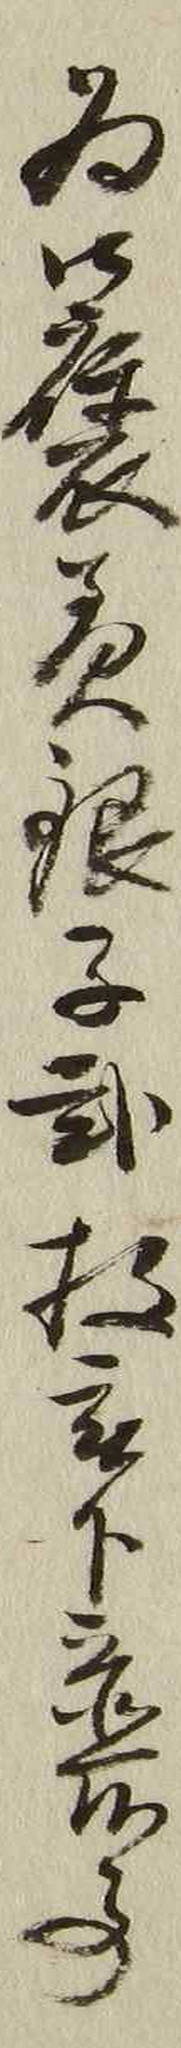為御褒美銀子弐枚被下置候事
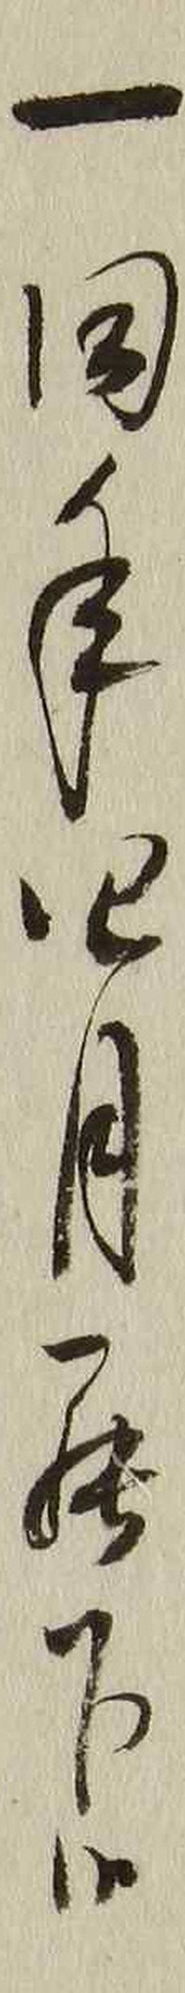一同年四月罷下候
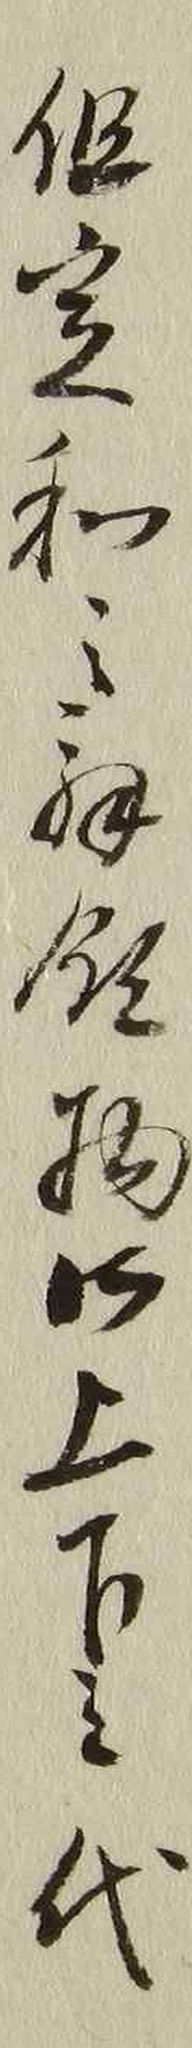但定和之拝領物御上下之代
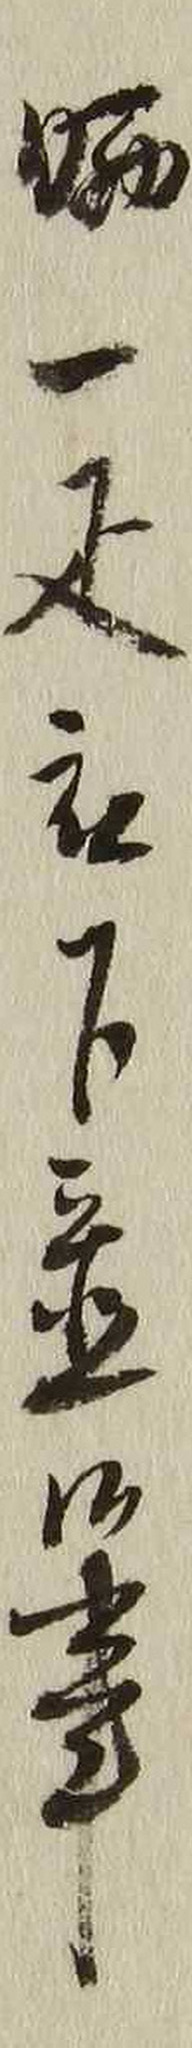晒一疋被下置候事
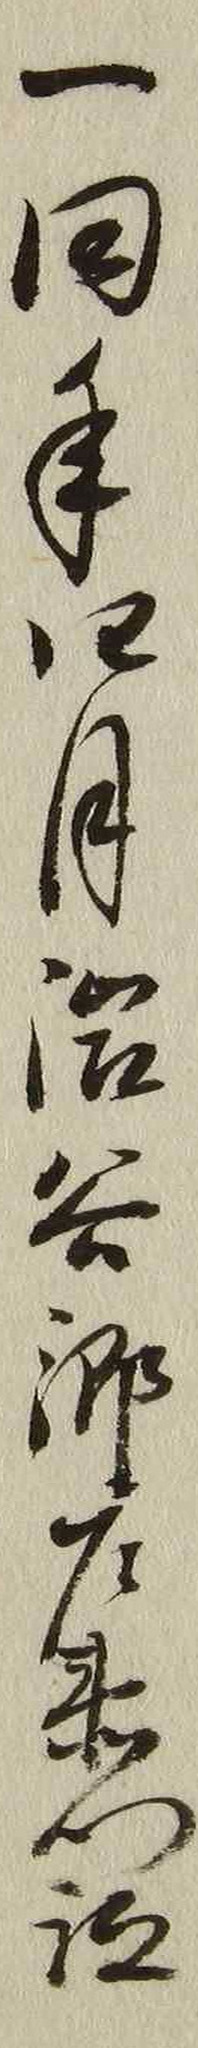一同年四月渋谷郷左衛門跡
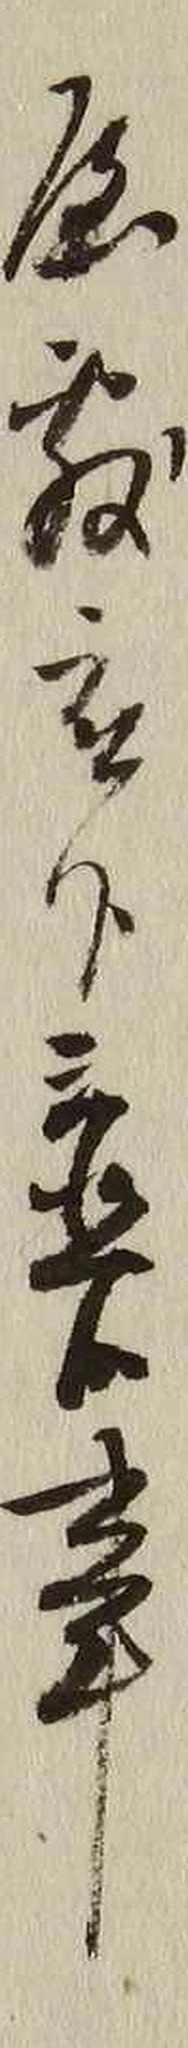屋敷被下置候事
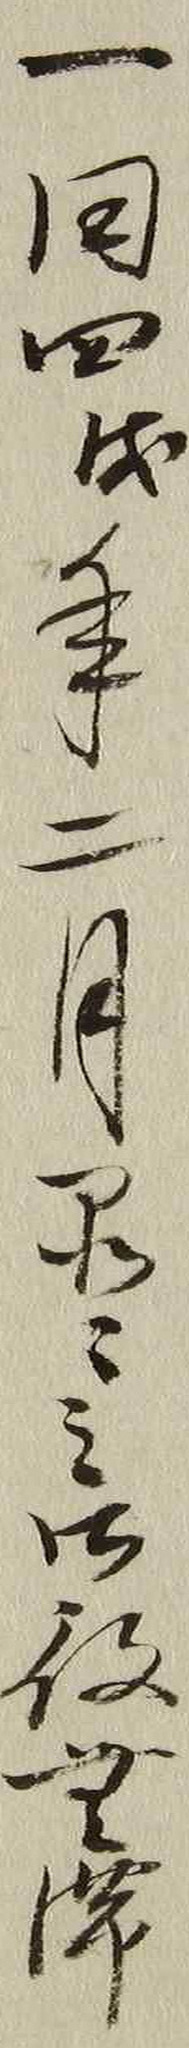一同四戌年二月品々之御役無滞
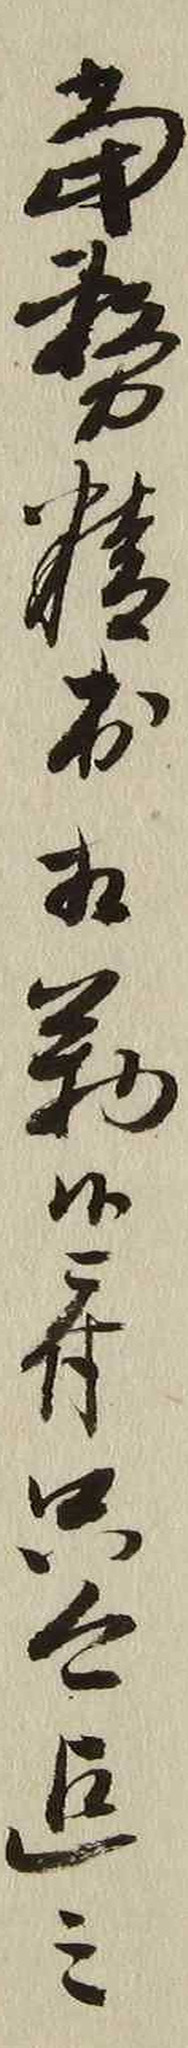当務精出相勤候ニ付只今迄之
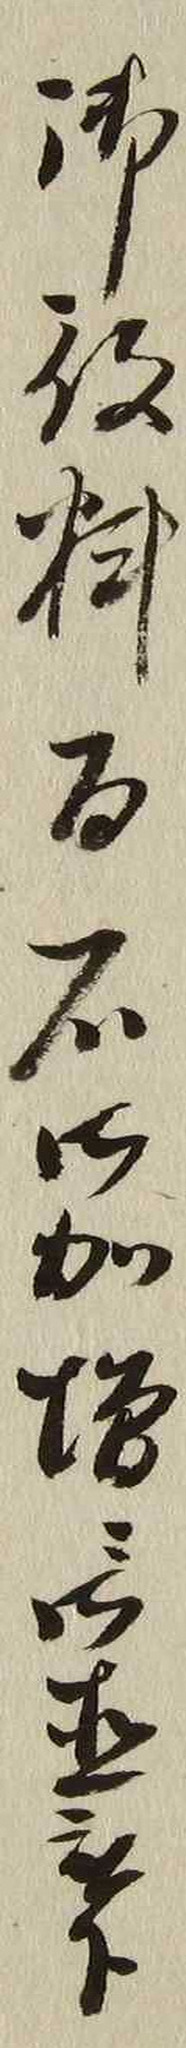御役料百石御加増ニ御直被下
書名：諸士系譜　巻之355　す之部5
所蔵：会津若松市立会津図書館
